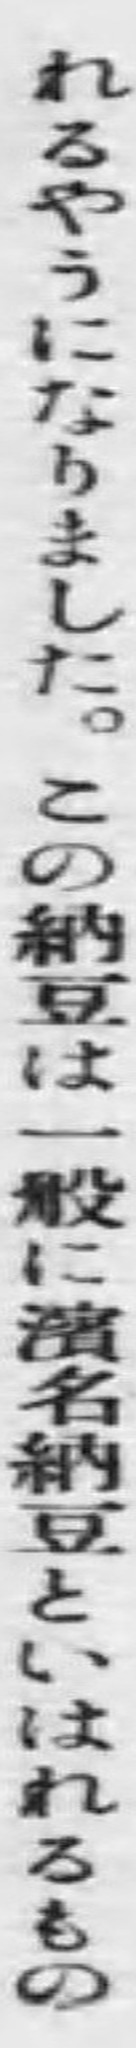れるやうになりました。この納豆は一般に浜名納豆といはれるもの
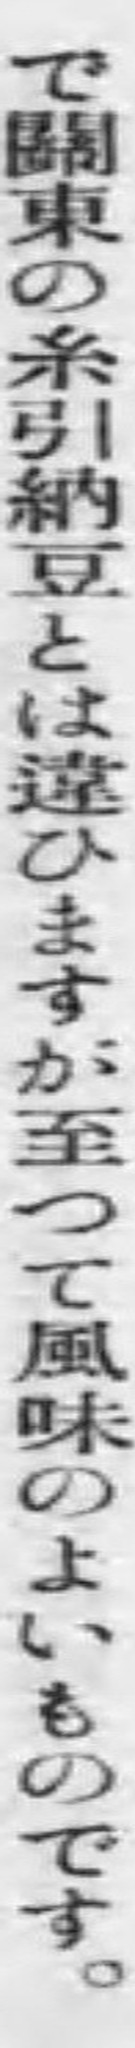で関東の糸引納豆とは違ひますが至つて風味のよいものです。
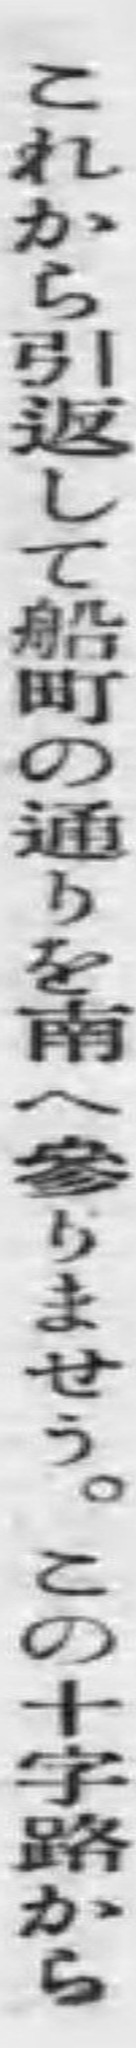これから引返して船町の通りを南へ参りませう。この十字路から
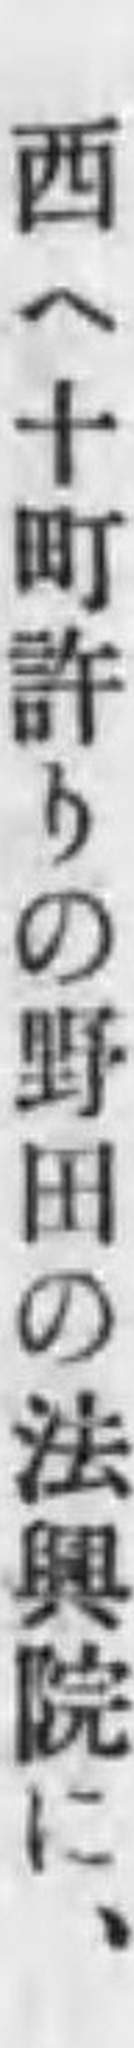西へ十町許りの野田の法興院に、
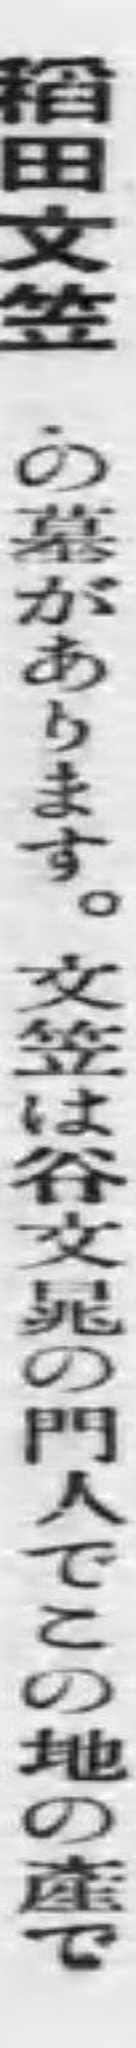稲田文笠の墓があります。文笠は谷文晁の門人でこの地の産で
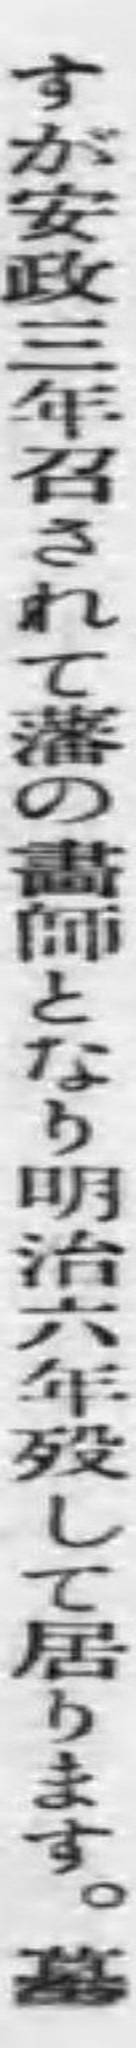すが安政三年召されて藩の画師となり明治六年歿して居ります。墓
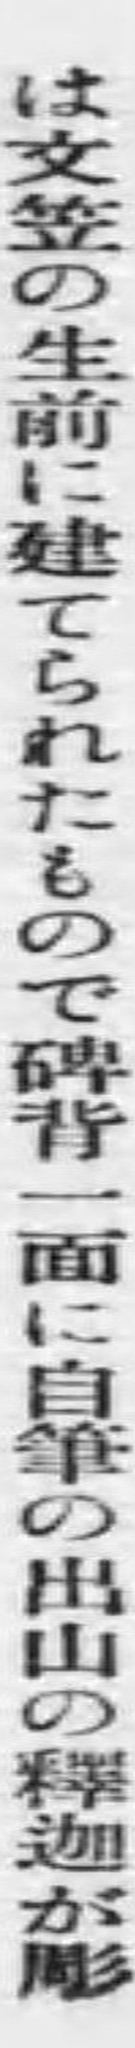は文笠の生前に建てられたもので碑背一面に自筆の出山の釈迦が彫
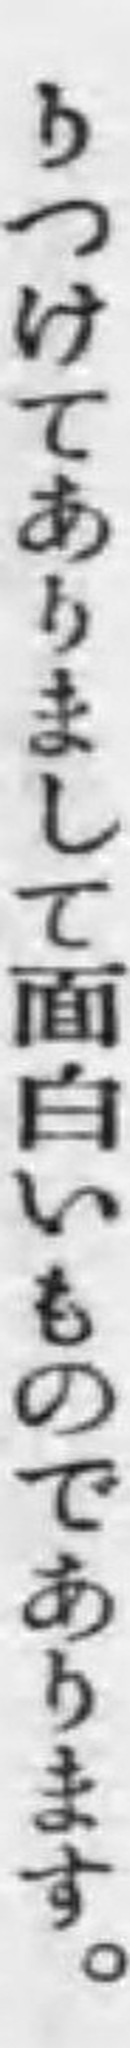りつけてありまして面白いものであります。
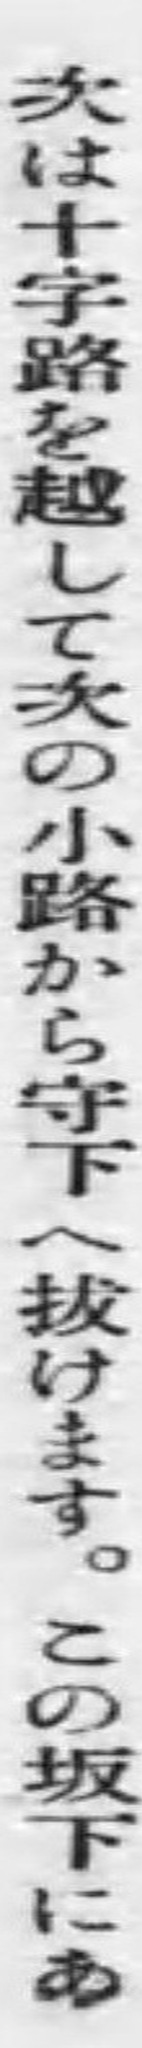次は十字路を越して次の小路から守下へ抜けます。この坂下にあ
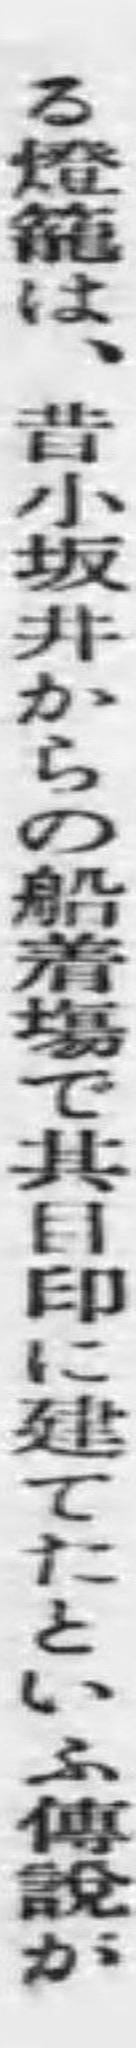る灯籠は、昔小坂井からの船着場で其目印に建てたといふ伝説が
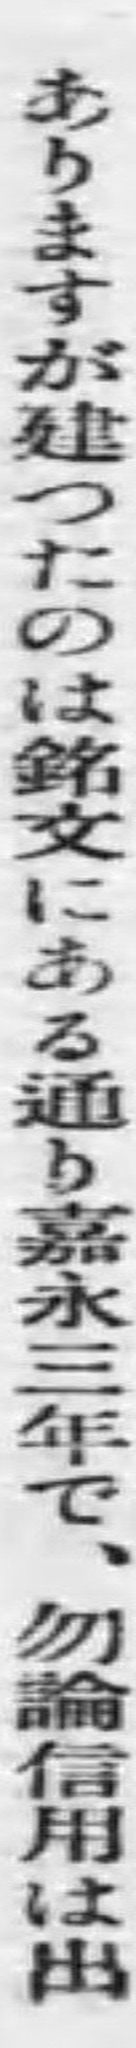ありますが建つたのは銘文にある通り嘉永三年で、勿論信用は出
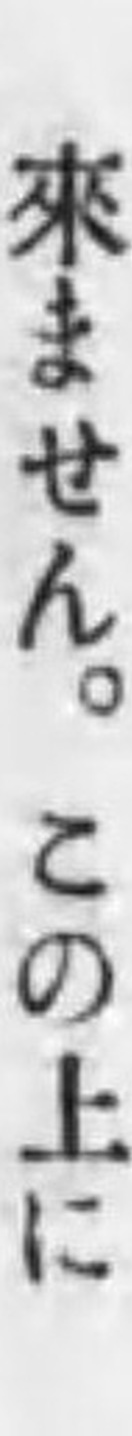来ません。この上に
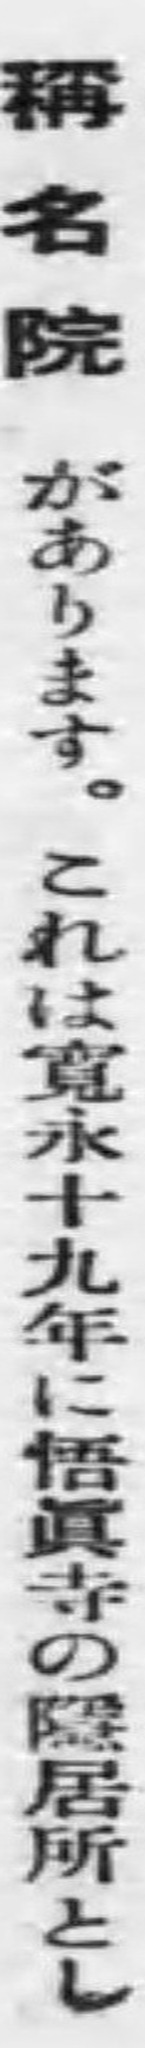称名院があります。これは寛永十九年に悟真寺の隠居所とし
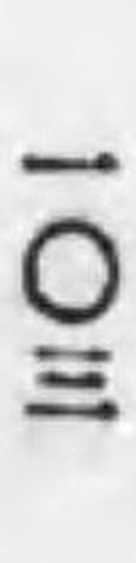一〇三

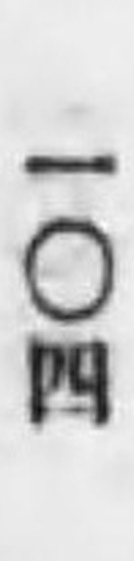一〇四
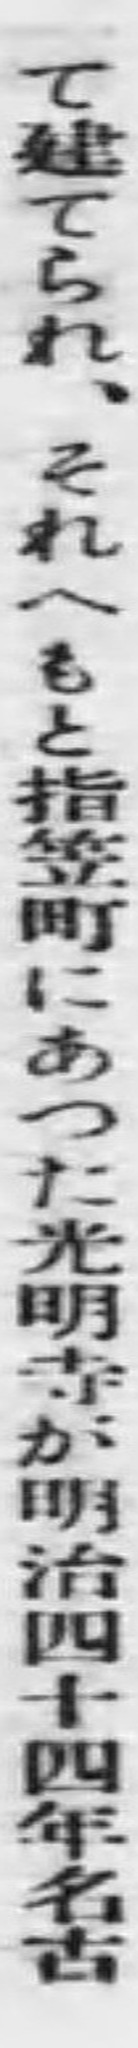て建てられ、それへもと指笠町にあつた光明寺が明治四十四年名古
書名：東三河道中記 : 豊橋市及其附近案内
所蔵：国立国会図書館 National Diet Library, JAPAN
